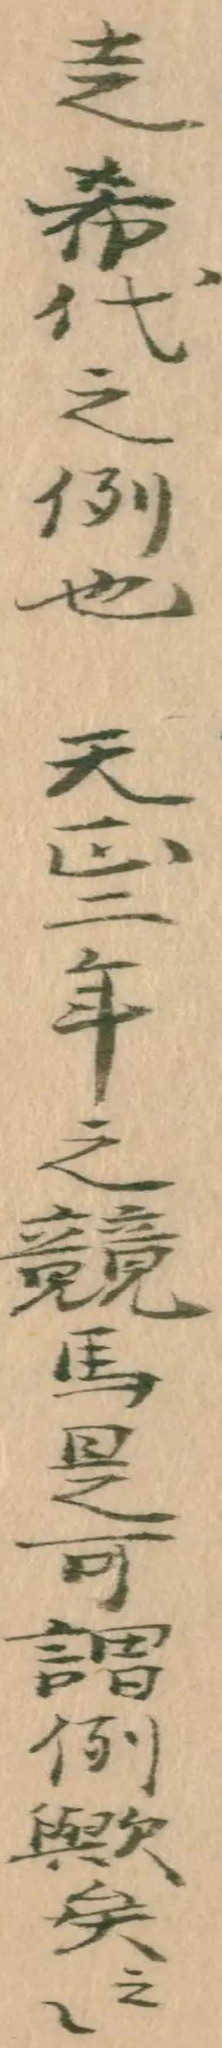走希代之例也天正二年之競馬是可謂例歟矣云々
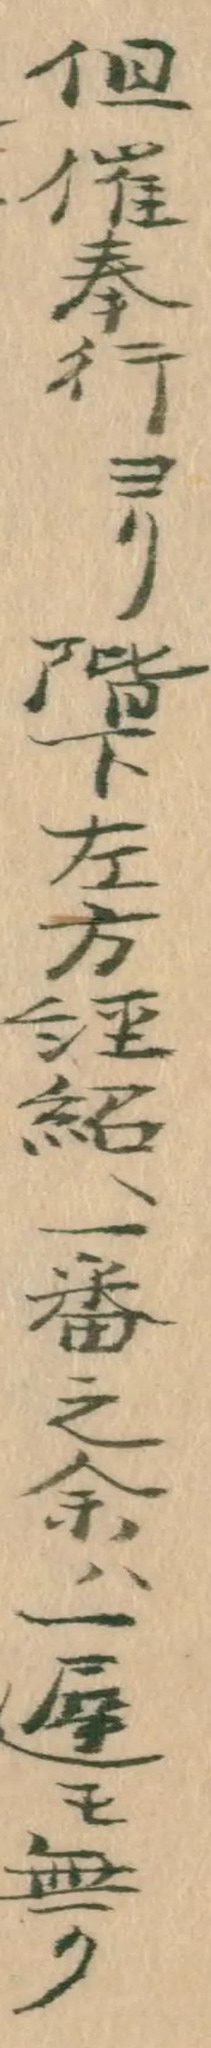但催奉行ヨリ階下左方経紹へ一番之余ハ一遅モ無ク
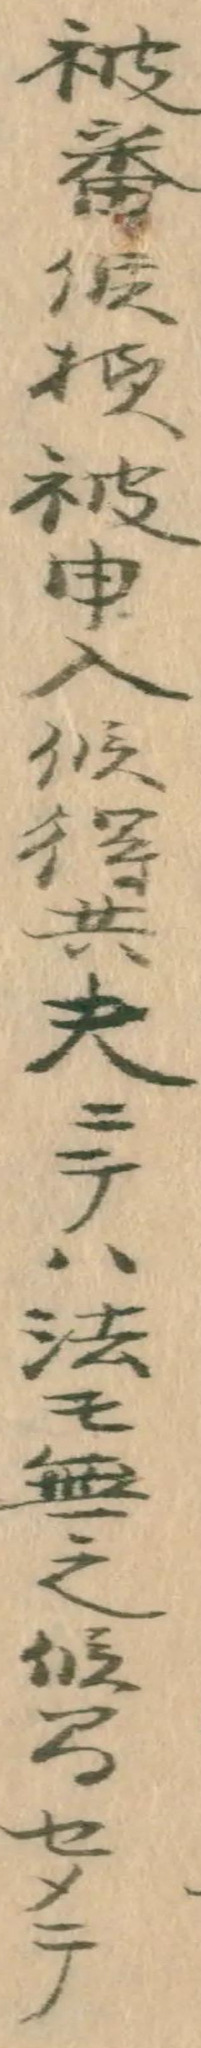被番候様被申入候得共夫ニテハ法モ無之候間セメテ
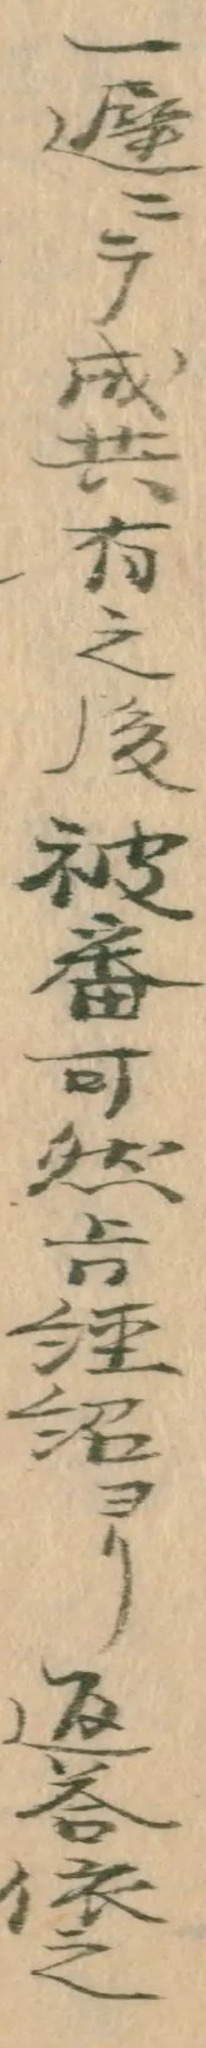一遅ニテ成共有之後被番可然旨経紹ヨリ返答依之
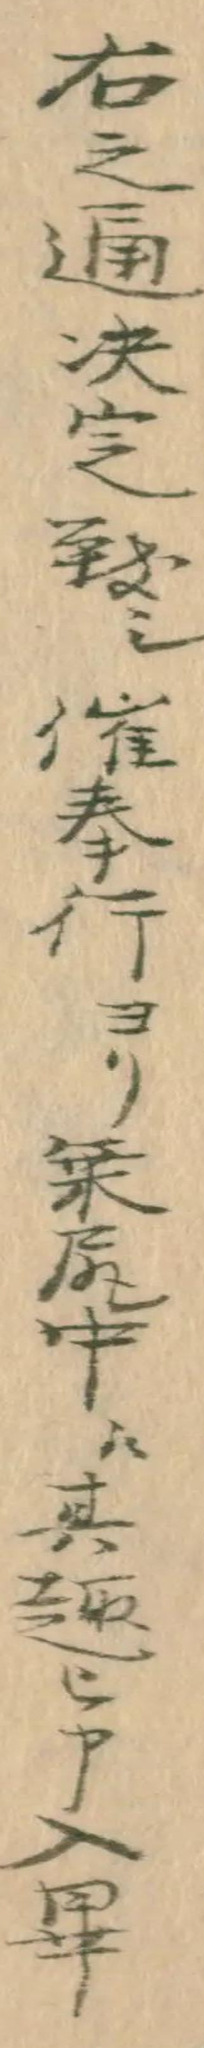右之通決定致シ催奉行ヨリ乗尻中江其趣被申入畢
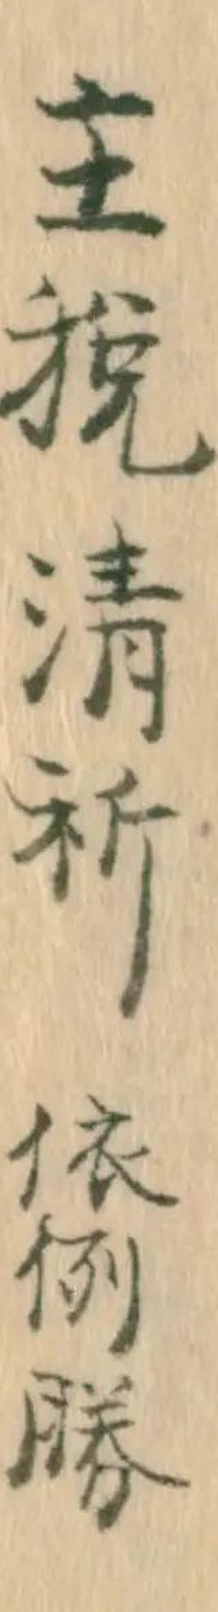左主税清祈依例勝
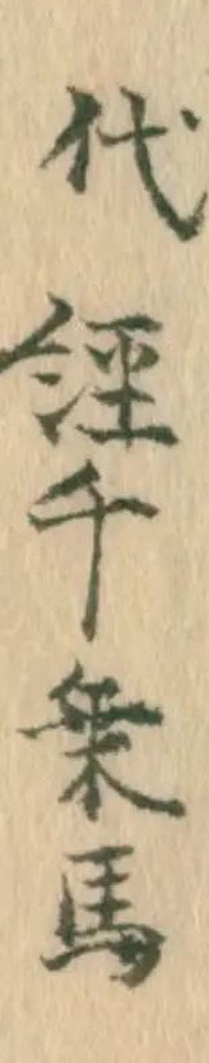代経千乗馬

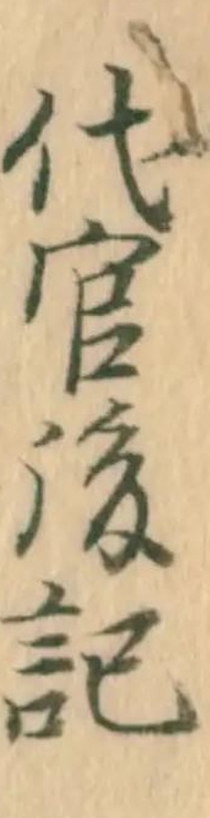代官後記
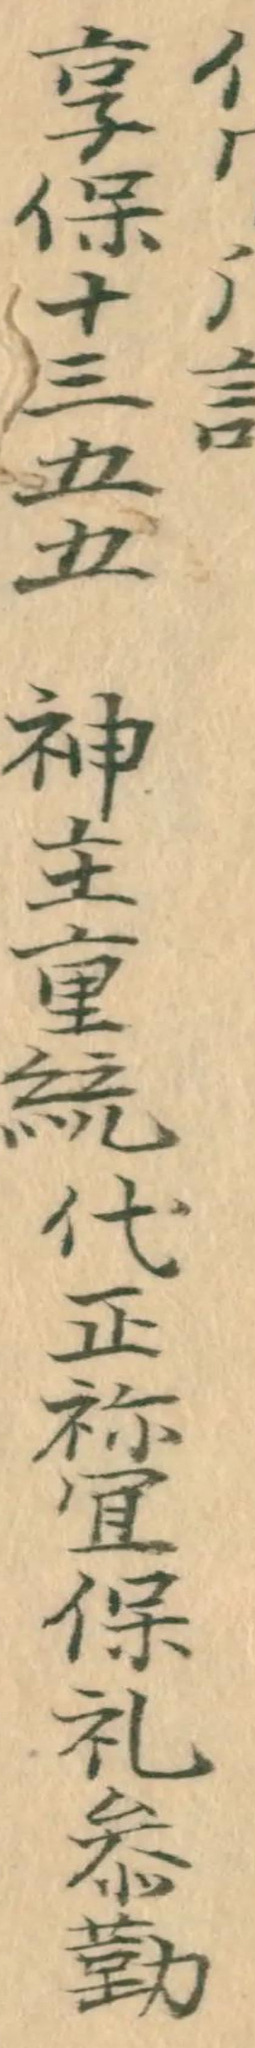享保十三五五神主重統代正称宜保礼参勤
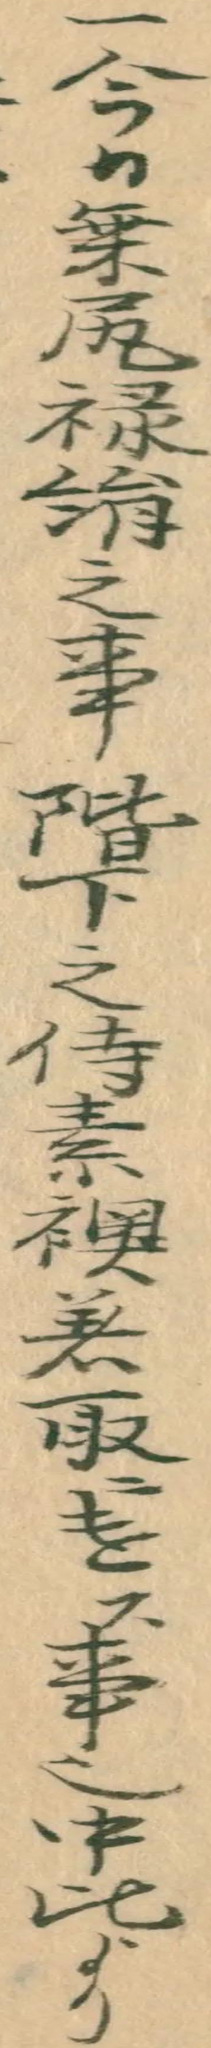一今日乗尻禄絹之事階下之侍素襖着取ニ遣ス事也中比より
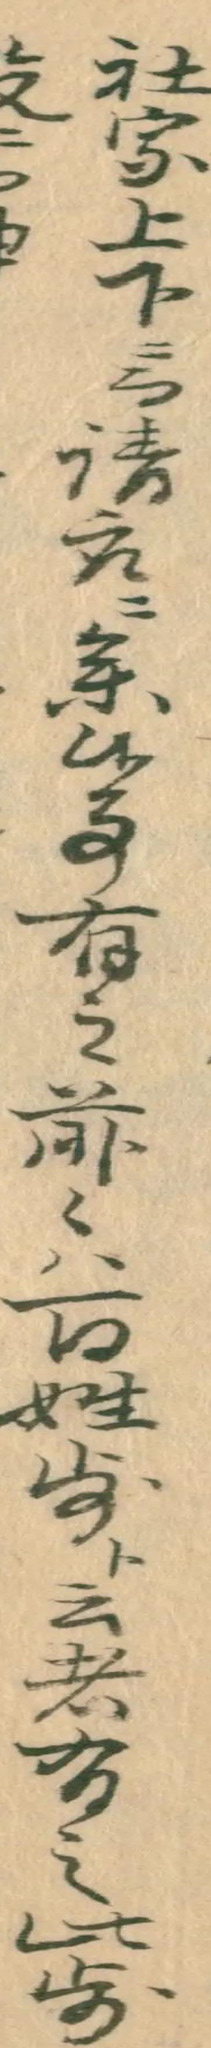社家上下ニ而請取ニ参候事有之前々ハ百姓歩ト云者有之此歩
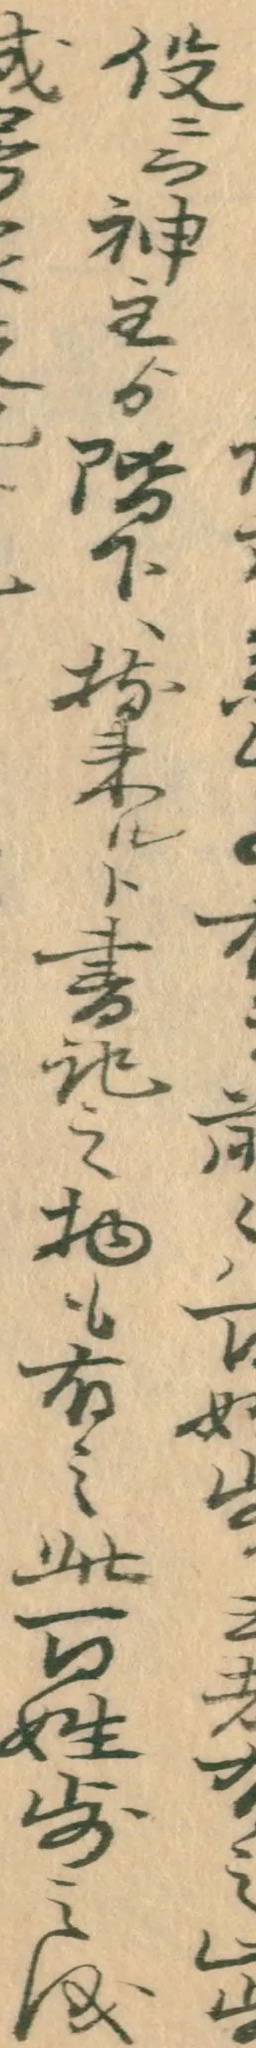役ニ而神主ゟ階下へ持来ルト書記之物も有之此百姓歩之儀
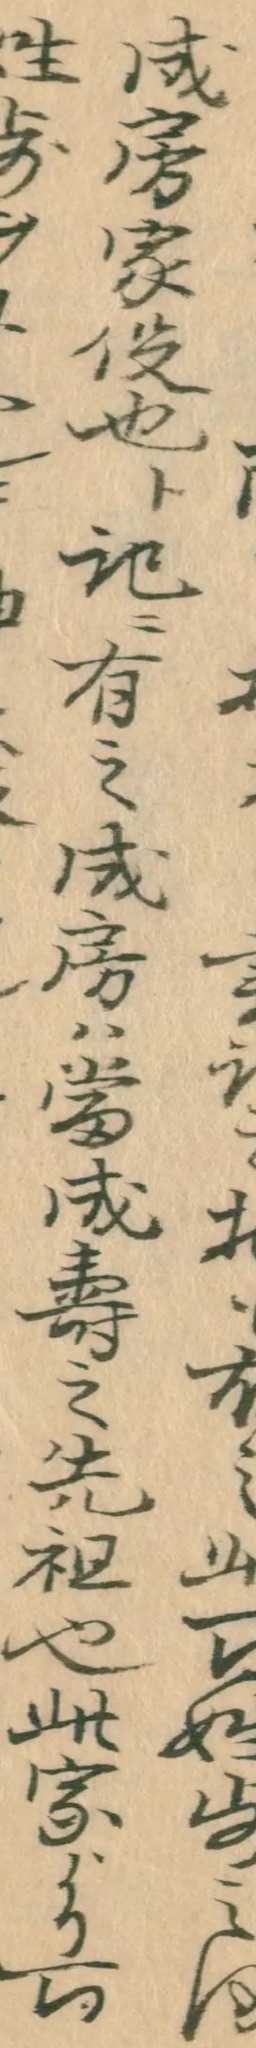成房家役也ト記ニ有之成房ハ当成寿之先祖也此家より百
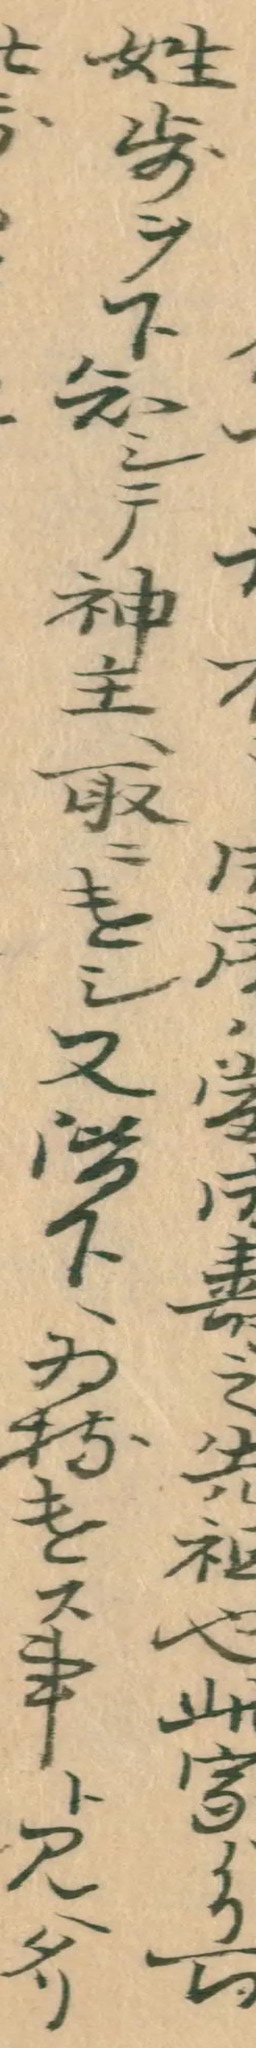姓歩ヲ下知シテ神主へ取ニ遣シ又階下へ為持遣ス事ト見ヘタリ
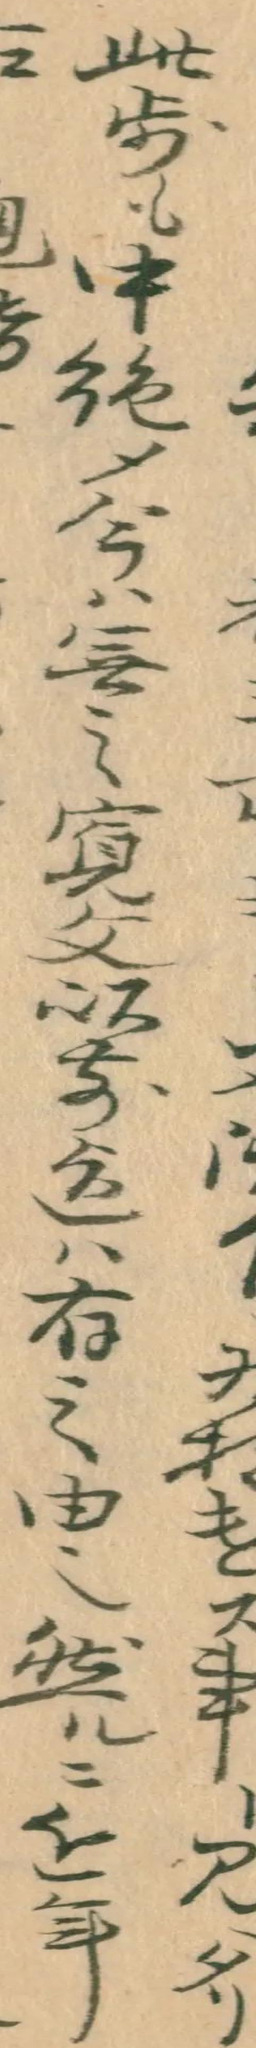此歩も中絶シテ今ハ無之寛文以前迄ハ有之由也然ルニ近年
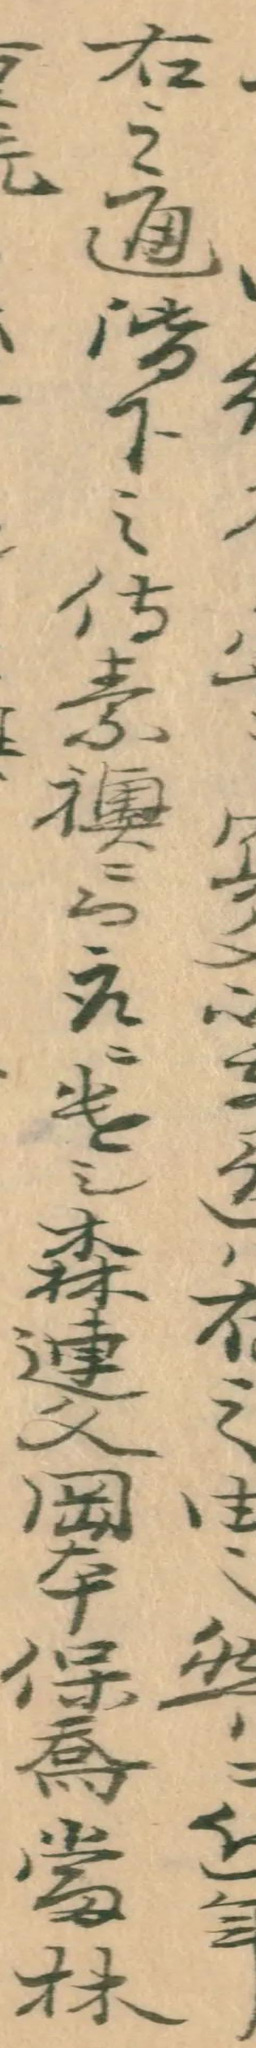右之通階下之侍素襖ニ而取に遣し森連久岡本保喬当林
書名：賀茂社記録. 第12冊
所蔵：国立国会図書館 National Diet Library, JAPAN
